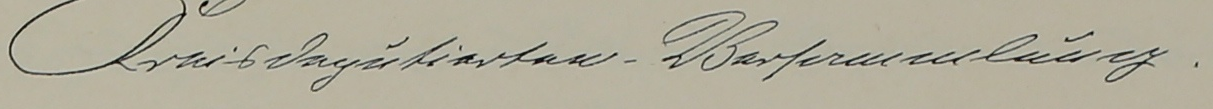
Kreisdeputierten-Versammlung.
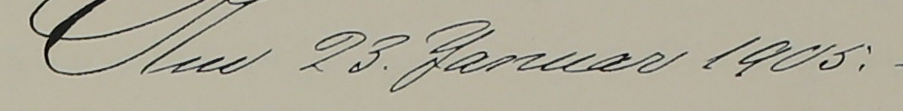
Am 23. Januar 1905.
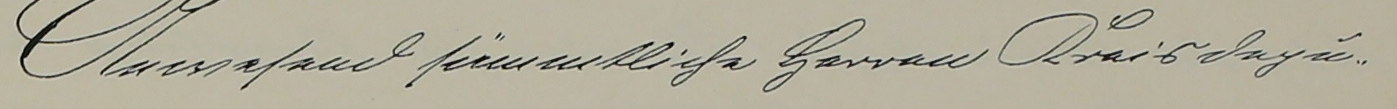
Anwesend sämmtliche Herren Kreisdepu-
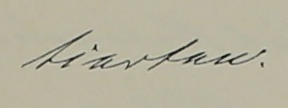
tierten.
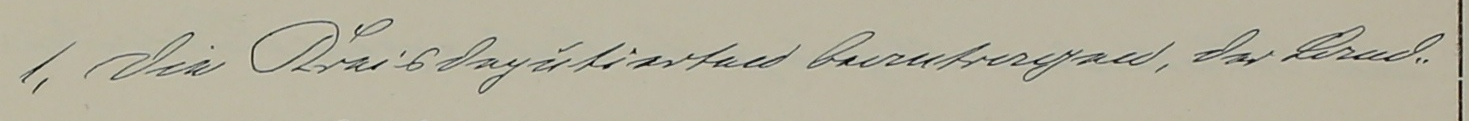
1. Die Kreisdeputierten beantragen, der Land-
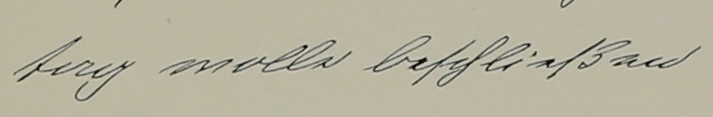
tag wolle beschließen
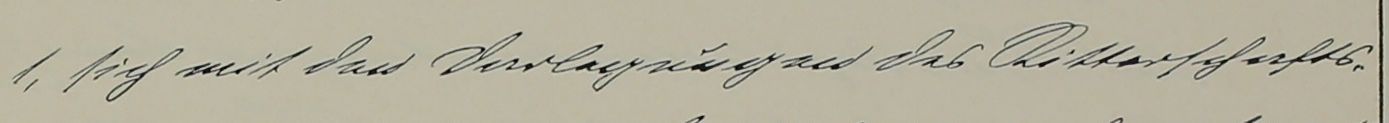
1. sich mit den Darlegungen des Ritterschafts-
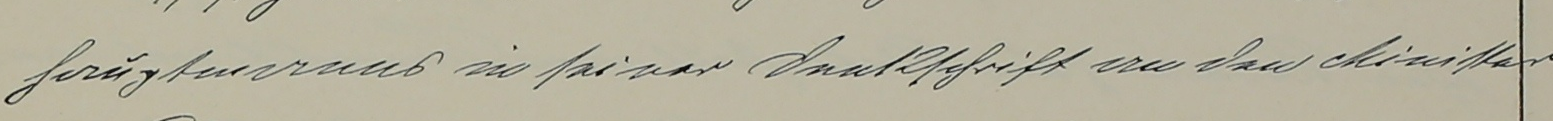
hauptmanns in seiner Denkschrift an den Minister
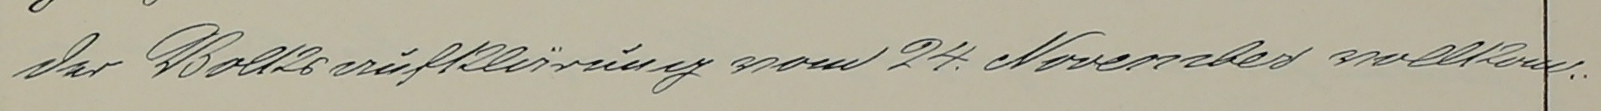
der Volksaufklärung vom 24. November vollkom-
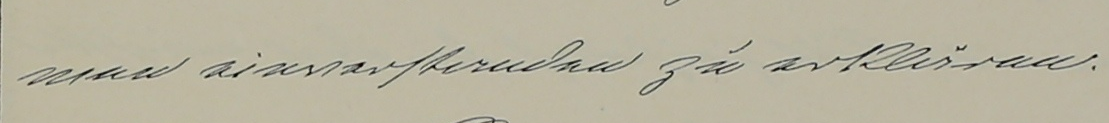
men einverstanden zu erklären.
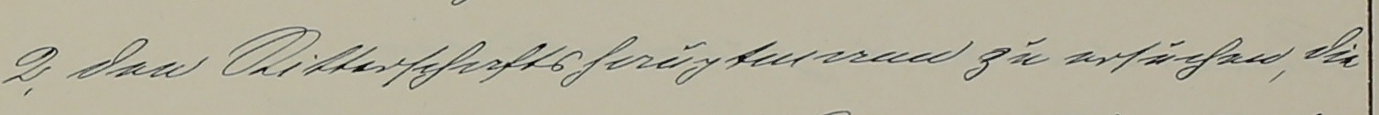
2. den Ritterschaftshauptmann zu ersuchen, die
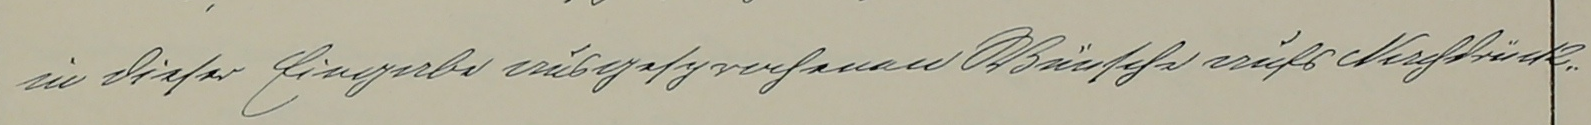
in dieser Eingabe ausgesprochenen Wünsche aufs Nachdrück-
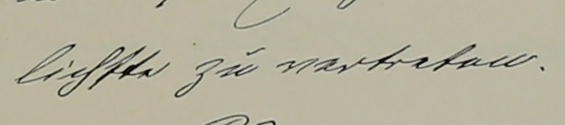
lichste zu vertreten.
